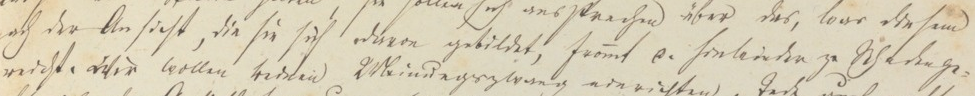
nach der Ansicht, die sie sich davon gebildet, frommt&. hinwieder zu Schaden ge-
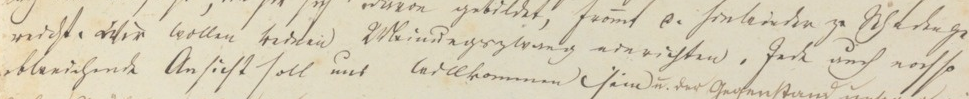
reicht. Wir wollen keinen Meinungszwang einrichten. Jede auch noch so
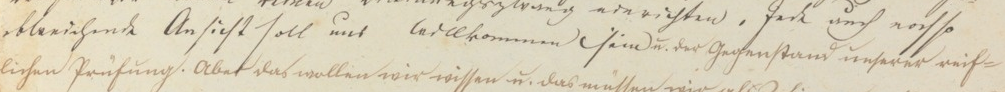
abweichende Ansicht soll uns willkommen sein u. der Gegenstand unserer reif-
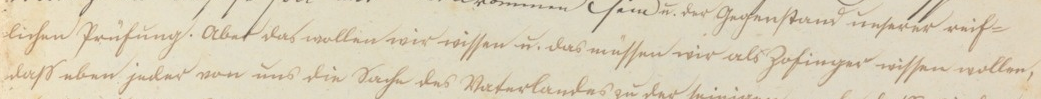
lichen Prüfung. Aber das wollen wir wissen u. das müssen wir als Zofinger wissen wollen,
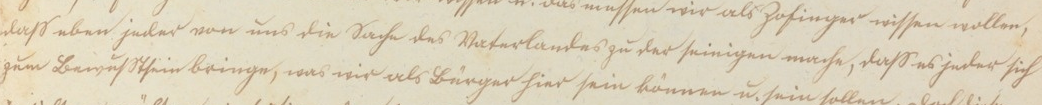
dass eben jeder von uns die Sache des Vaterlandes zu der seinigen mache, daß es jeder sich
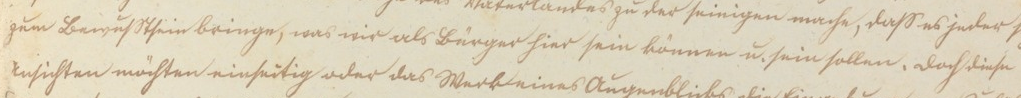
zum Bewusstsein bringe, was wir als Bürger hier sein können u. sein sollen. Doch diese
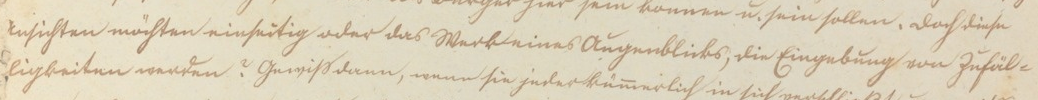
Ansichten möchten einseitig oder das Werk eines Augenblicks, die Eingebung von Zufäl-
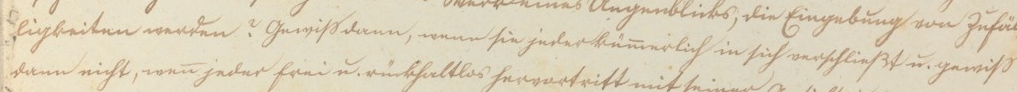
ligkeiten werden? Gewiss dann, wenn sie jeder kümmerlich in sich verschließt u. gewiss
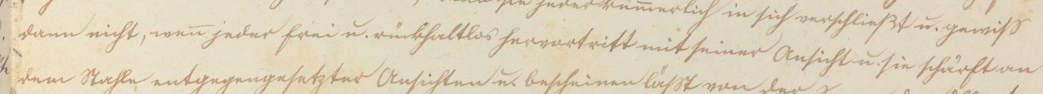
dann nicht, wenn jeder frei u. rückhaltlos hervortritt mit seiner Ansicht u. sie schärft an
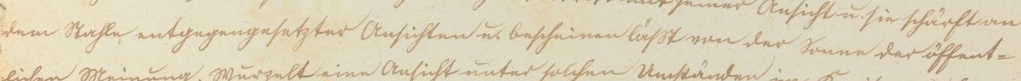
dem Stahle entgegengesetzter Ansichten u. bescheinen lässt von der Sonne der öffent-
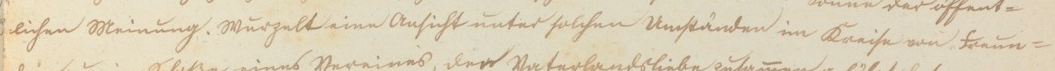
lichen Meinung. Wurzelt eine Ansicht unter solchen Umständen im Kreise von Freun-
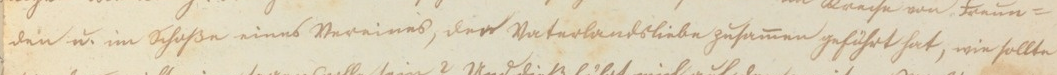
den u. im Schoße eines Vereines, den Vaterlandsliebe zusammen geführt hat, wie sollte
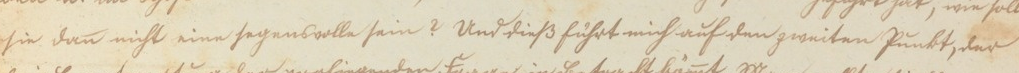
sie dann nicht eine segensvolle sein? Und dieß führt mich auf den zweiten Punkt, der
